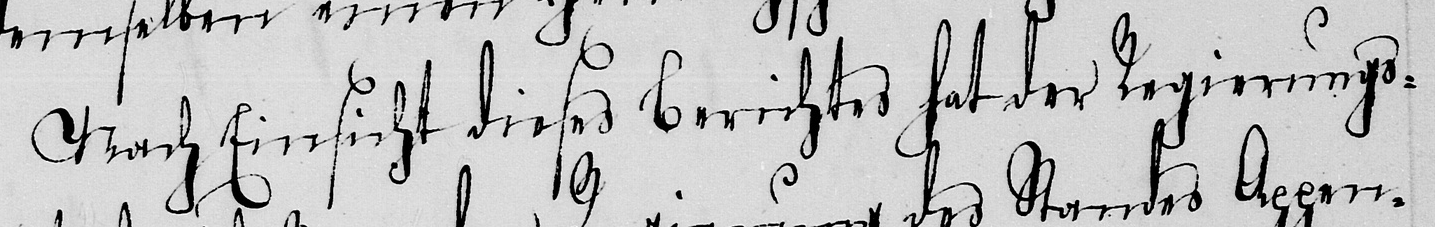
Nach Einsicht dieses Berichtes hat der Regierungs¬
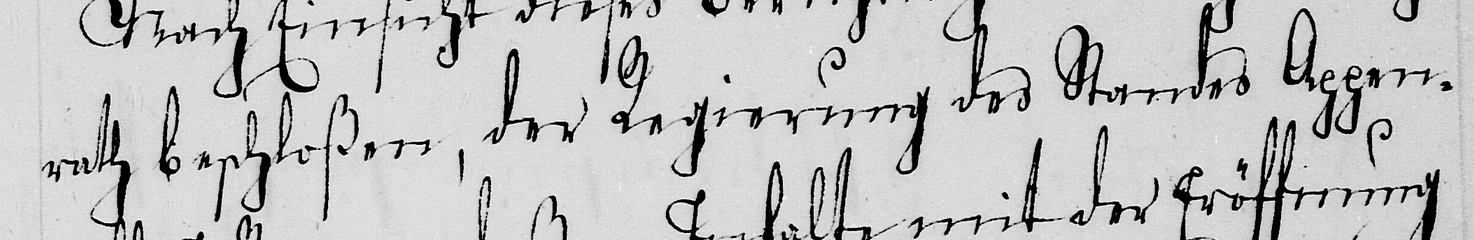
rath beschloßen, der Regierung des Standes Appen¬
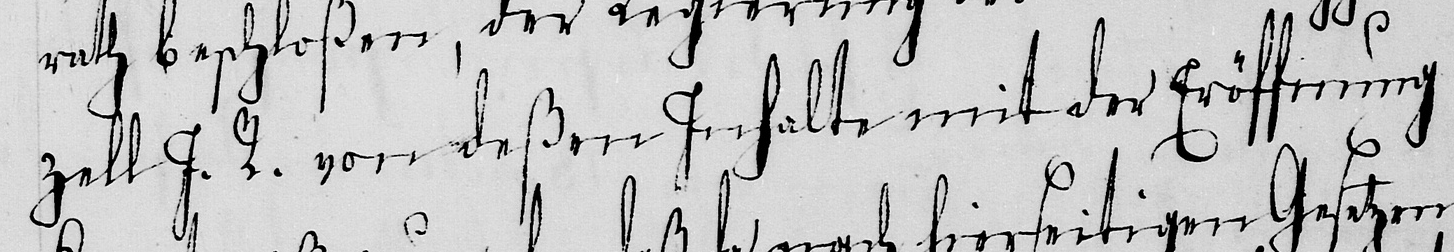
zell I. R. von deßen Inhalte mit der Eröffnung
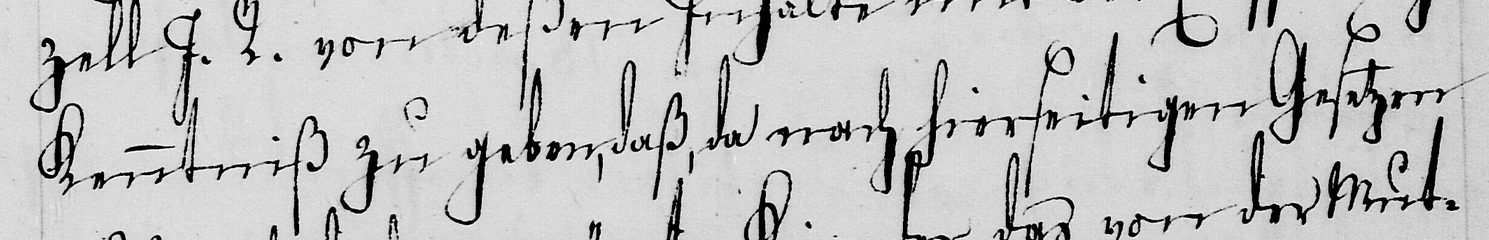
Kenntniß zu geben, daß, da nach hierseitigen Gesetzen
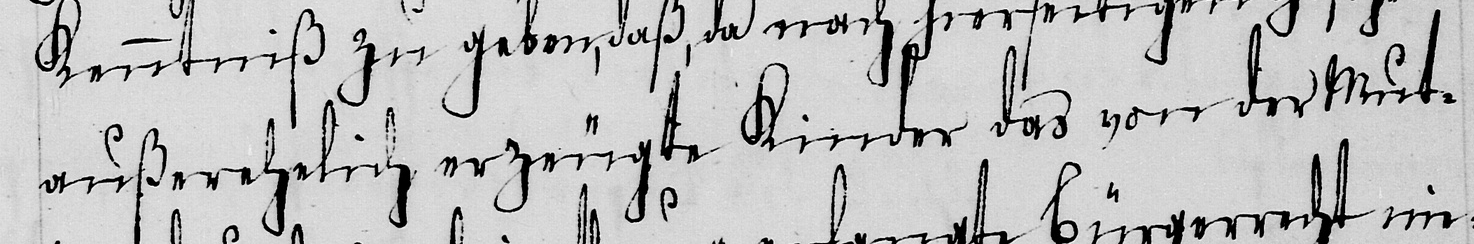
außerehelich erzeugte Kinder das von der Mut¬
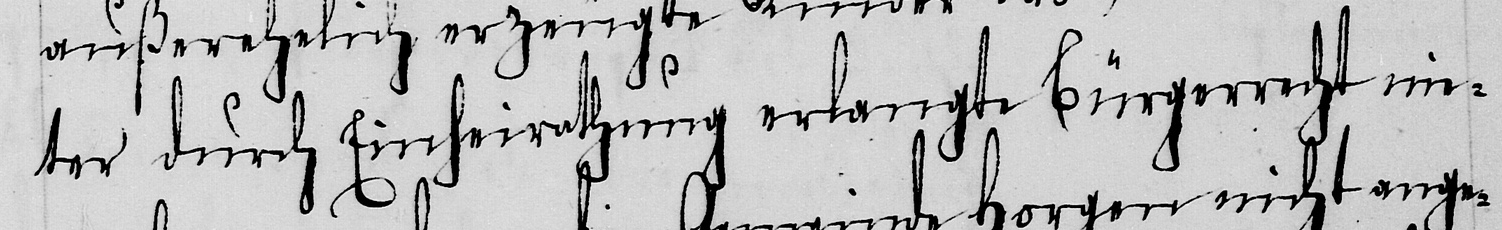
ter durch Einheirathung erlangte Bürgerrecht ni¬
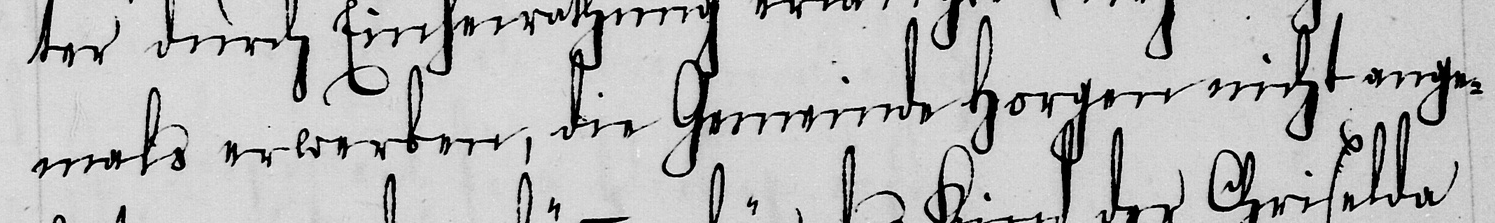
emals erwerben, die Gemeinde Horgen nicht ange¬
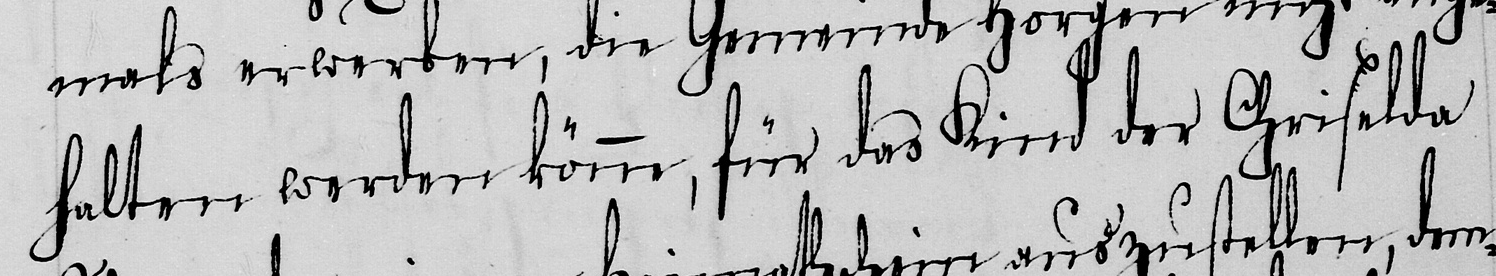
halten werden könne, für das Kind der Chriselda
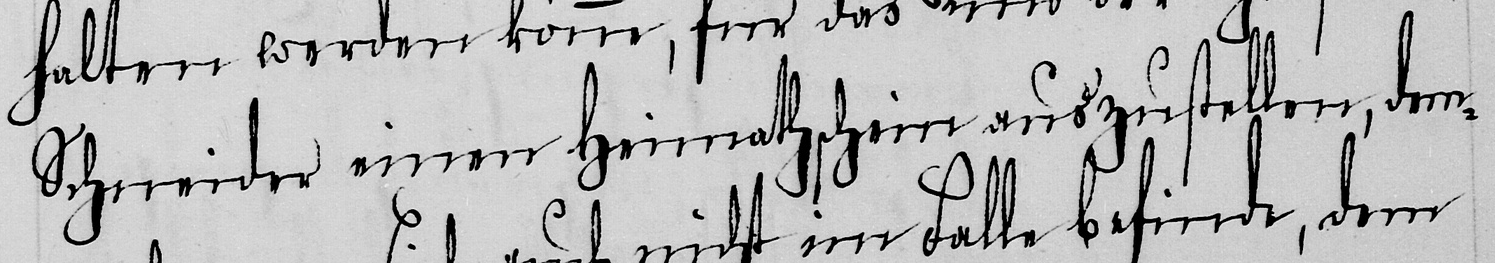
Schneider einen Heimathschein auszustellen, dem¬
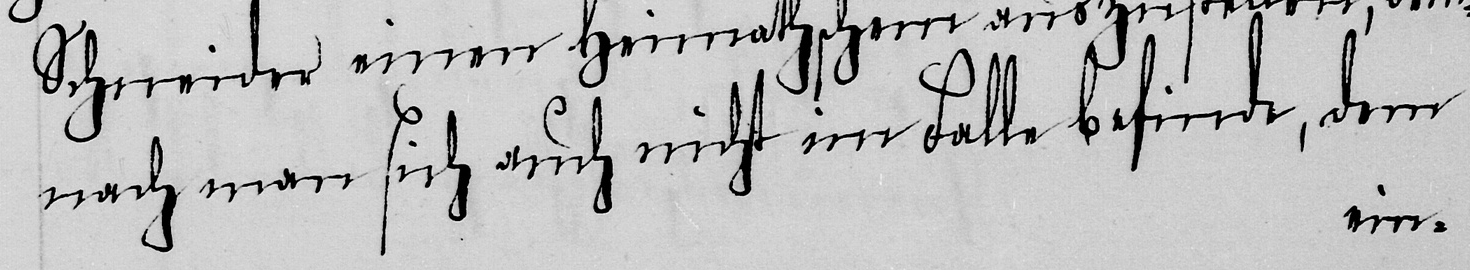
nach man sich auch nicht im Falle befinde, dem
